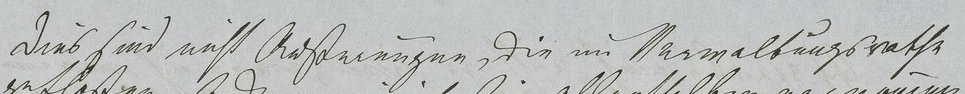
Dies sind nicht Äußerungen, die im Verwaltungsrathe
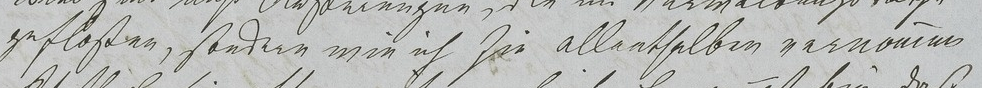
gefloßen, sondern wie ich sie allenthalben vernommen.
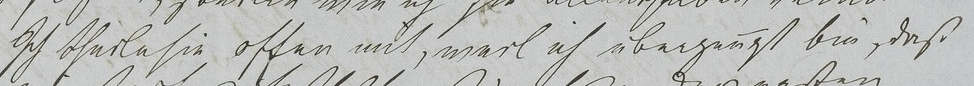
Ich theile sie offen mit, weil ich überzeugt bin, daß
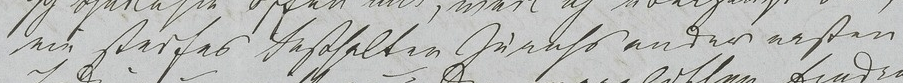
ein steifes Festhalten Zürichs an der ersten
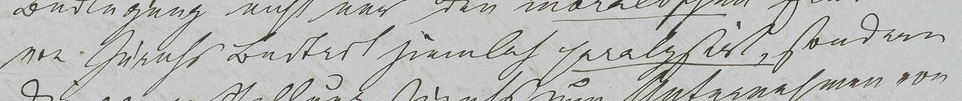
von Zürichs Beitrit ziemlich paralysirt, sondern
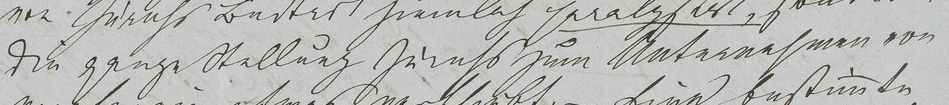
die ganze Stellung Zürichs zum Unternehmen von
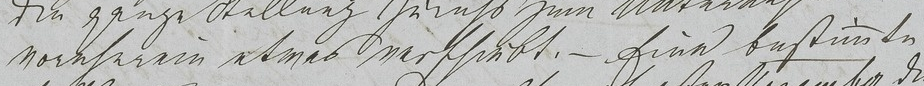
vornherein etwas verschiebt. – Eine bestimmte
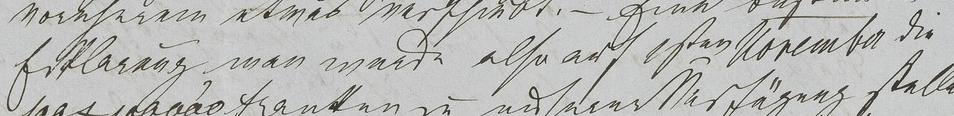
Erklärung, man werde also auf 1sten November die
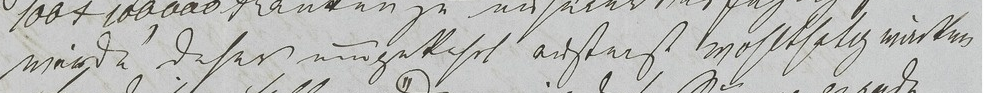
würde daher umgekehrt äußerst wohlthätig wircken.
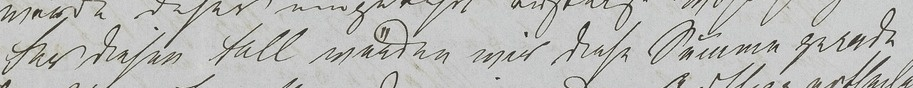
Für diesen Fall würden wir diese Summe gerade
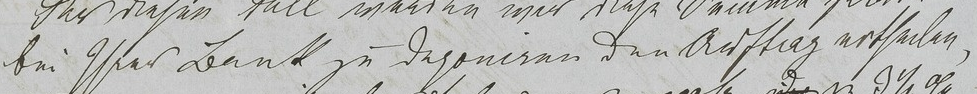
bei Ihrer Bank zu deponiren den Auftrag ertheilen,
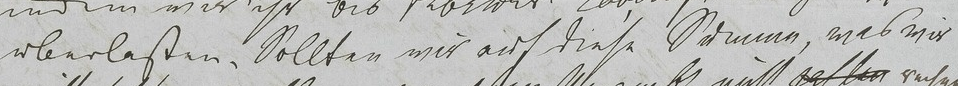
überlaßen. Sollten wir auf diese Summe, was wir
